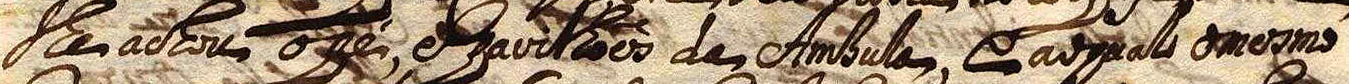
lhe achou o pé, e pavilhoẽs da Ambula, E ao qual o mesmo
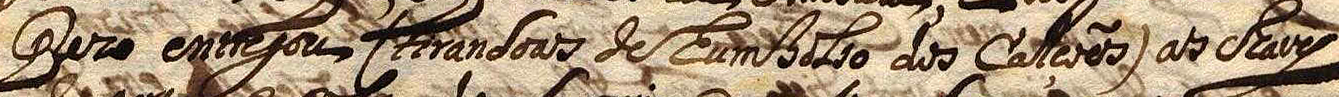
pRezo entregou (tirandoas de hum bolso dos Calçoẽs) as chaves
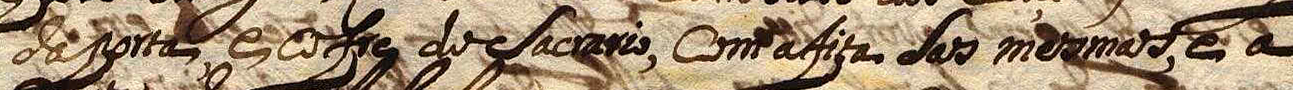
da porta, e cofre do Sacrario, Com a fita dos mesmos, e a
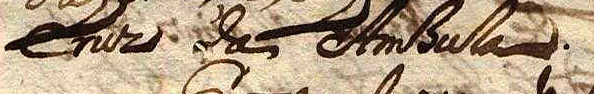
Cruz da Ambula.
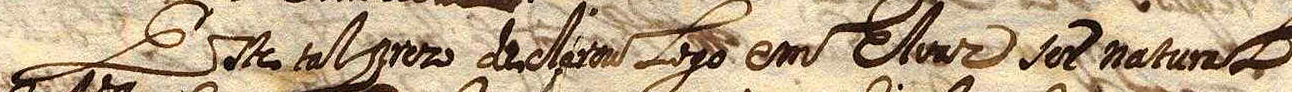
Este tal prezo declarou Logo em Elvaz ser naturaL
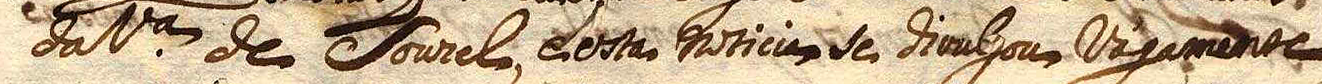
da V.a de Souzel, e esta noticia se divulgou Vagamente
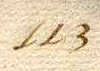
113
